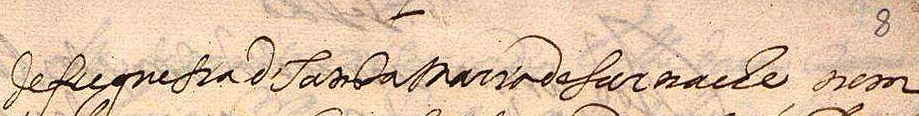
de freguesia de Sancta Maria de Sarnache, nem
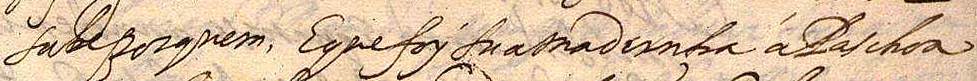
sabe por quem, E que foy sua madrinha a Paschoa
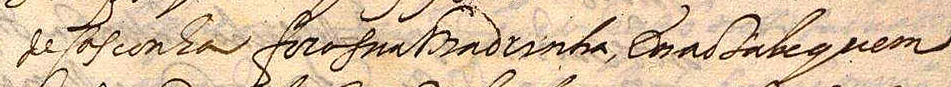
de Casconha fora sua Madrinha, E naõ sabe quem
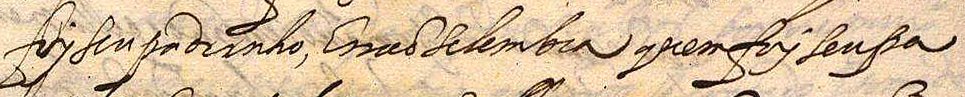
foy seu padrinho, E naõ se lembra quem foy seu pa
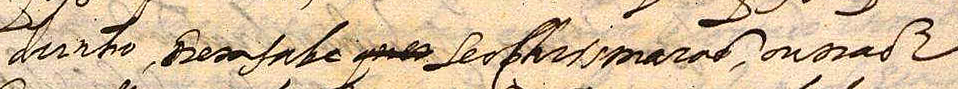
drinho, nem sabe que se o Chrismaraõ, ou naõ
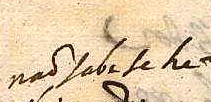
naõ sabe se he
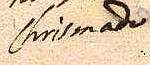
Chrismado
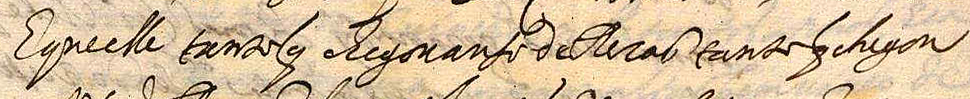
E que elle tanto q̄ chegou a uso de Rezaõ tanto q̄ chegou
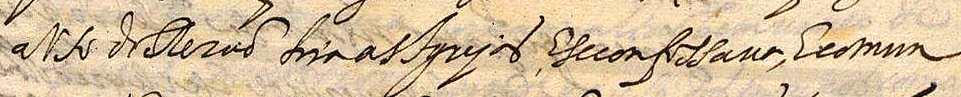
a Vso de Rezaõ hia as Igrejas, E se confessaua, E comun
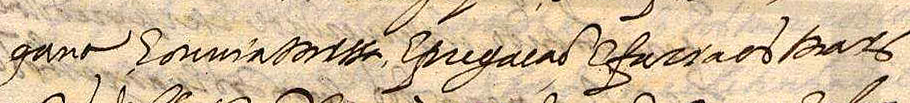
gaua, E ouuia missa E pregaçaõ e fazia os mais
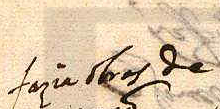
fazia obras de
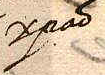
xpaõ
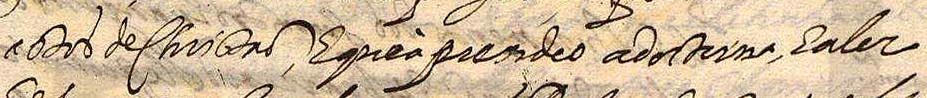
actos de Christaõ, E que aprendeo a doctrina, E a ler
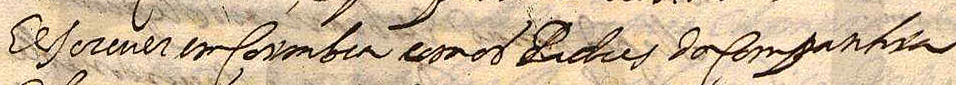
E escreuer em Coimbra com os Padres da Companhia
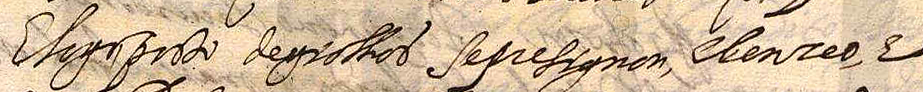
E logo posto de giolhos se presignou, E benzeo, E
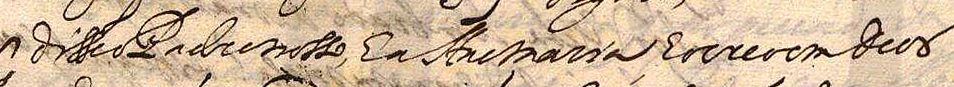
disse o Padre nosso, E a Aue maria, e o creo em Deos
